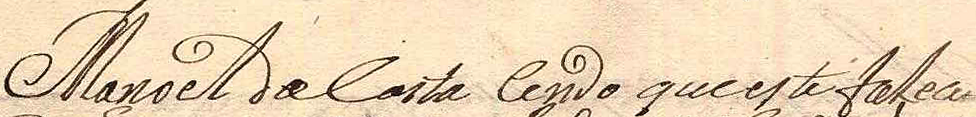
Manoel da Costa Cendo que este faLece_
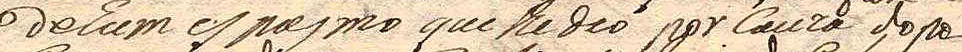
de hum espasmo que lhe deo por cauza do po
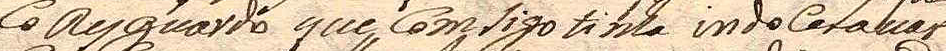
Co Resguardo que Comsigo tinha indo Ce Lauar
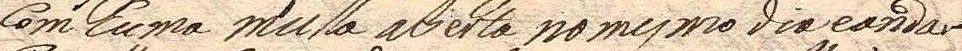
Com huma mulla aberta no mesmo dia e andar
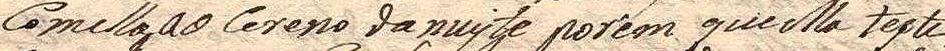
Com ella ao cereno da nuyte porem que ella teste
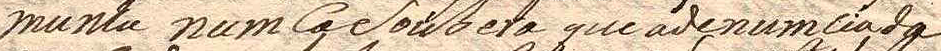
munha numCa Soubera que a denumciada
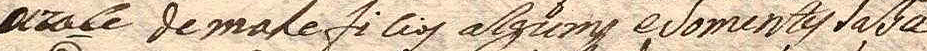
uzaçe de maLeficios algums e Somentes saba
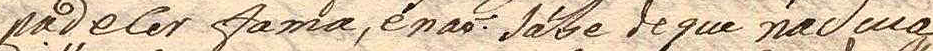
padecer fama, e naõ sabe de que na Seua
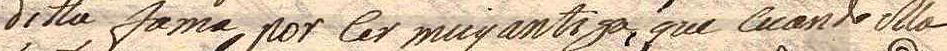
ditta fama, por cer muy antiga, que cuando ella
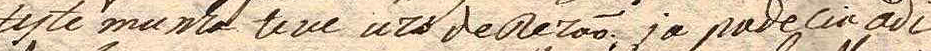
testemunha teve uzo de Rezaõ, ja padecia a di
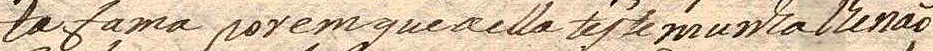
ta fama porem que a ella testemunha lhe naõ
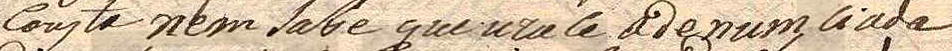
consta nem sabe que uzace a denumciada
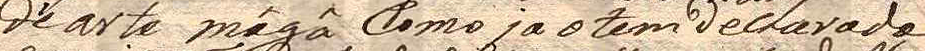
de arte mágá Como ja o tem decLarado
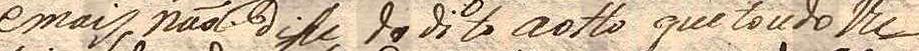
e mais não disse do dito aotto que toudo lhe
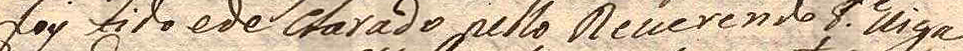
foy Lido e decLarado pello Reuerendo P.e Uiga
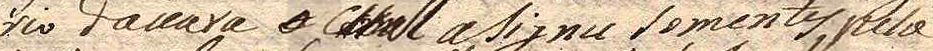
rio da uara o cual asignu somentes, pela
